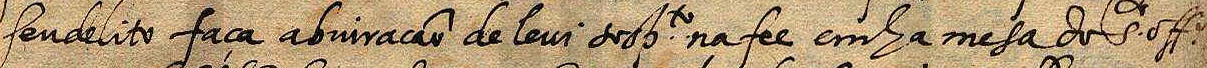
seu delito faça abiuracaõ de leui sosp.to na fee em ha mesa do s.to off.o
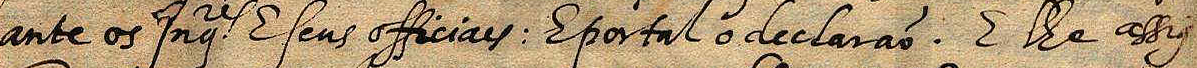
ante os Jnq.res E seus officiaes: E por tal o declaraõ. E lhe assig
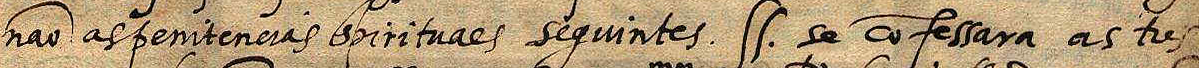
não as penitencias spirituaes seguintes .ss. se c̄ofessara as tres
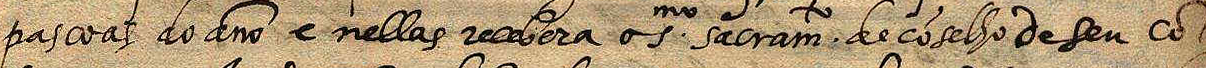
pascoas do an̄o e nellas recebera o smo. sacramto. de cōselho de seu cō
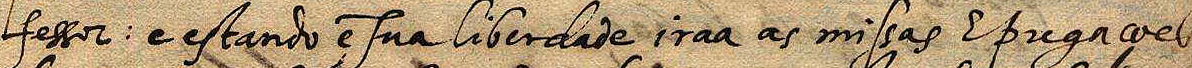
fessor: e estando ē sua liberdade iraa as missas E pregaçoẽs
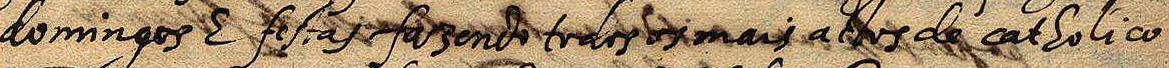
domingos E festas fazendo todos os mais actos de catholico
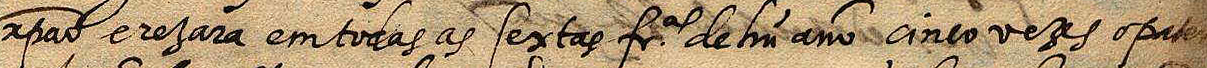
xpão e rezara em todas as sextas fr.as de hū an̄o cinco vezes o pater
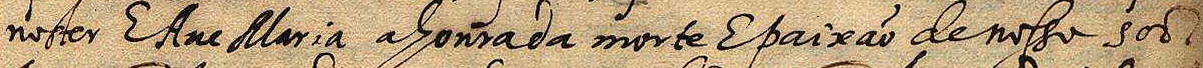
noster E Aue Maria a honra da morte E paixaõ de nosso sor̄
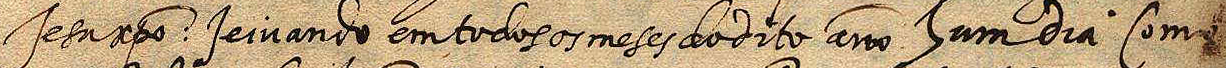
Jesu xp̄o: Jeiuando em todos os meses do dito an̄o hum dia Como
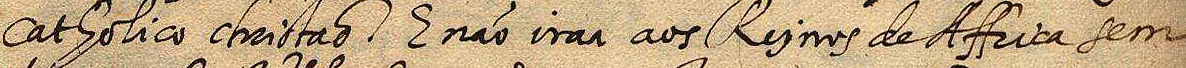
catholico christaõ. E naõ iraa aos Reynos de Affrica sem
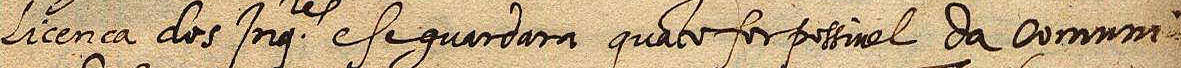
licenca dos Jnq.res e se guardara quāto for possiuel da comuni
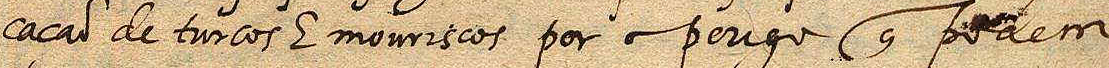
caçaõ de turcos E mouriscos por o perigo q̄ podem
